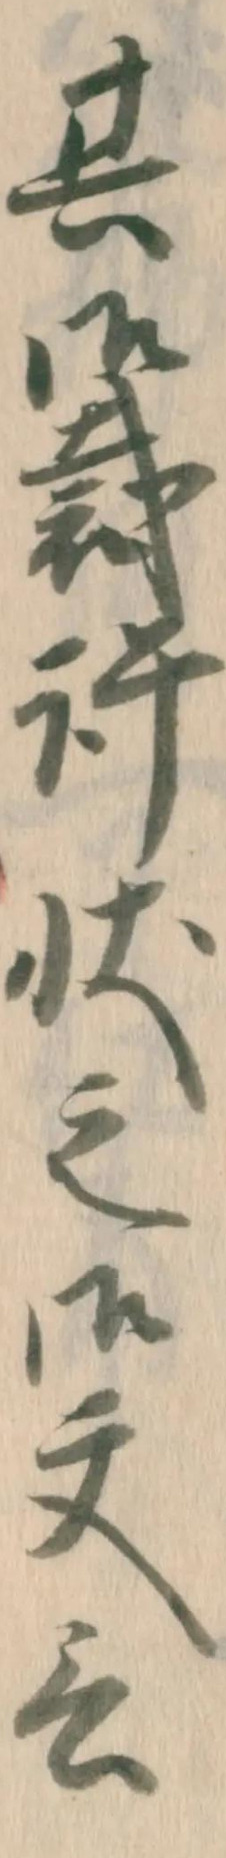其御裁許状之御文言
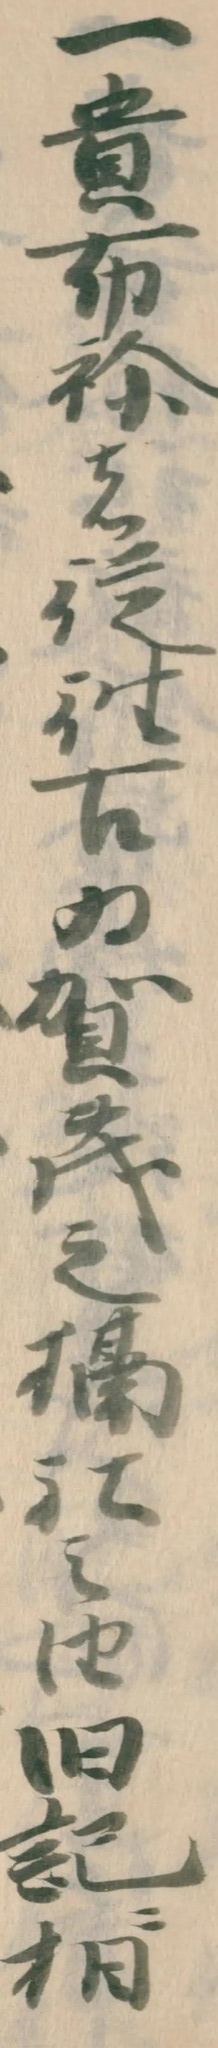一貴ふねは従往古為賀茂之摂社之由旧記相
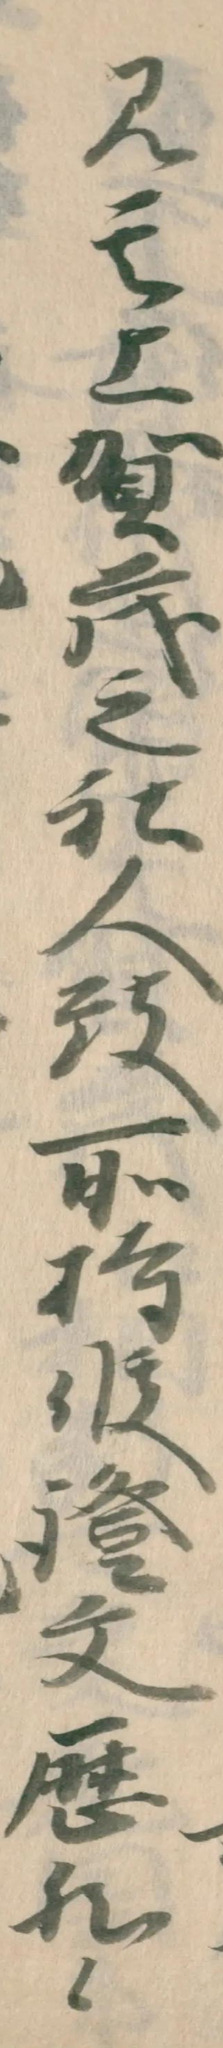見其上賀茂之社人致所持候証文歴然候
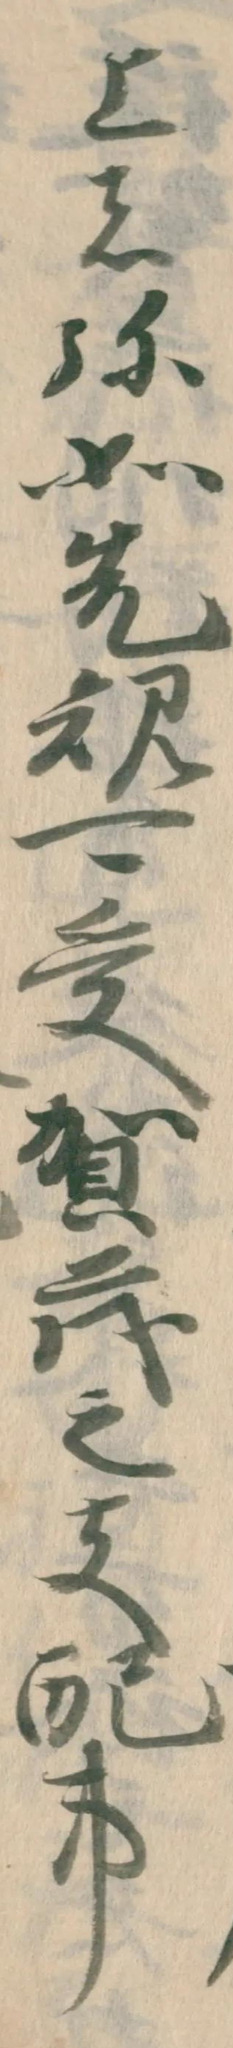上は弥如先規可受賀茂之支配事
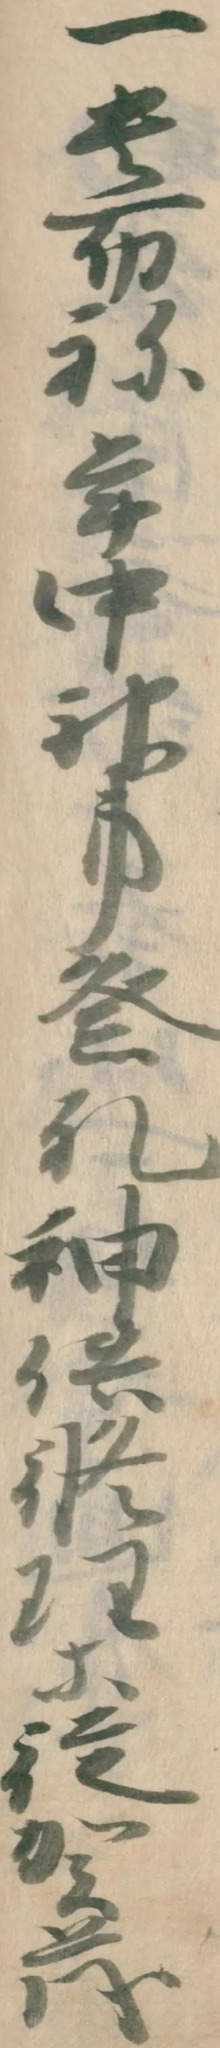一貴ふね年中神事祭礼神供修理等従賀茂

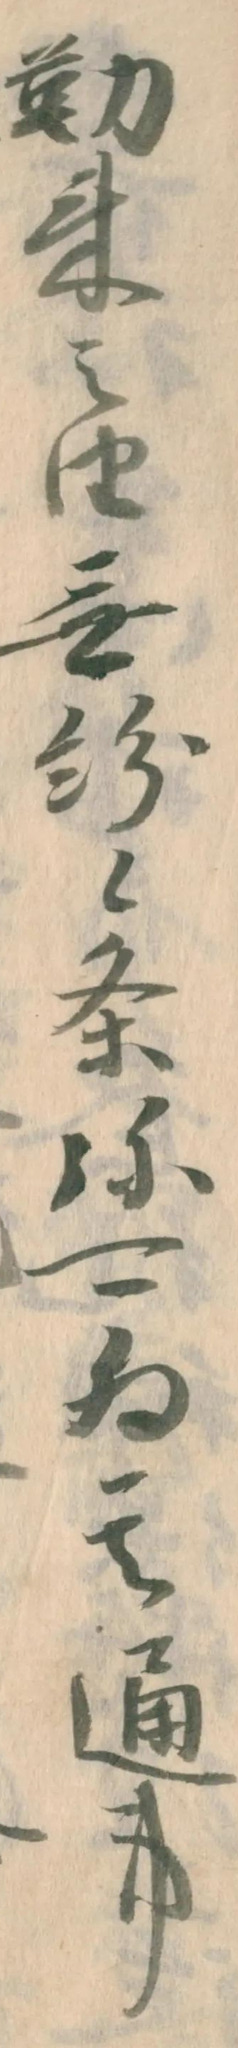勤来之由無紛候条弥可為其通事
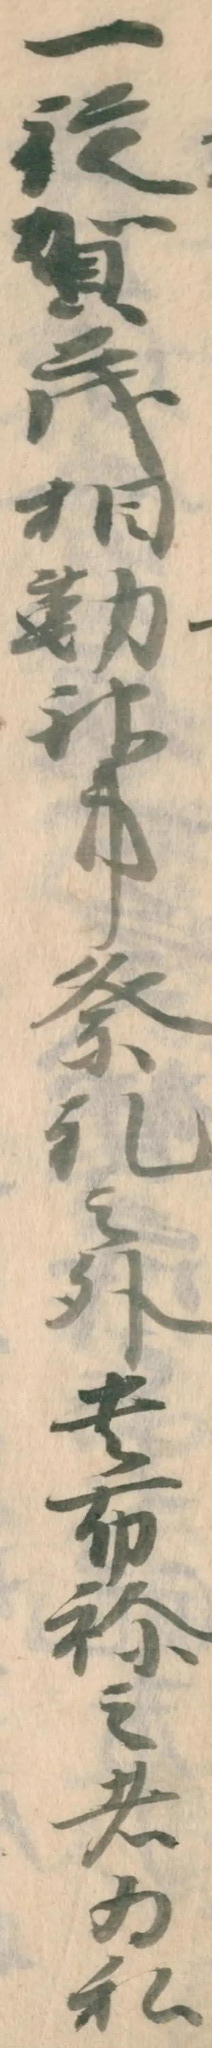一従賀茂相勤神事祭礼之外貴ふね之者為私
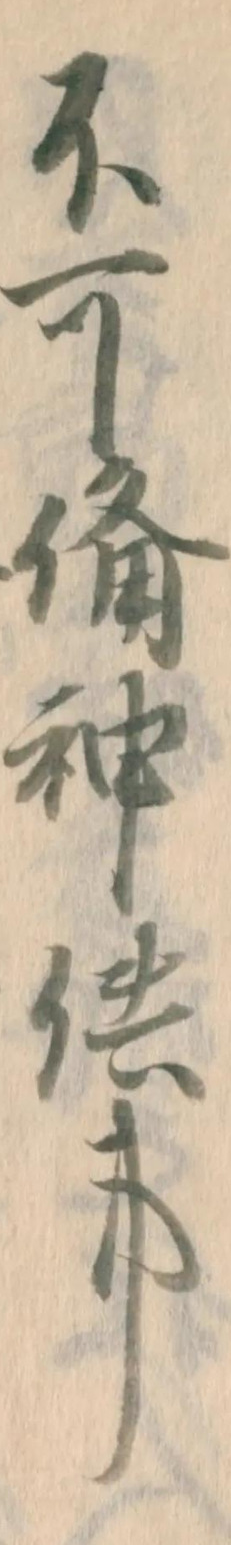不可備神供事
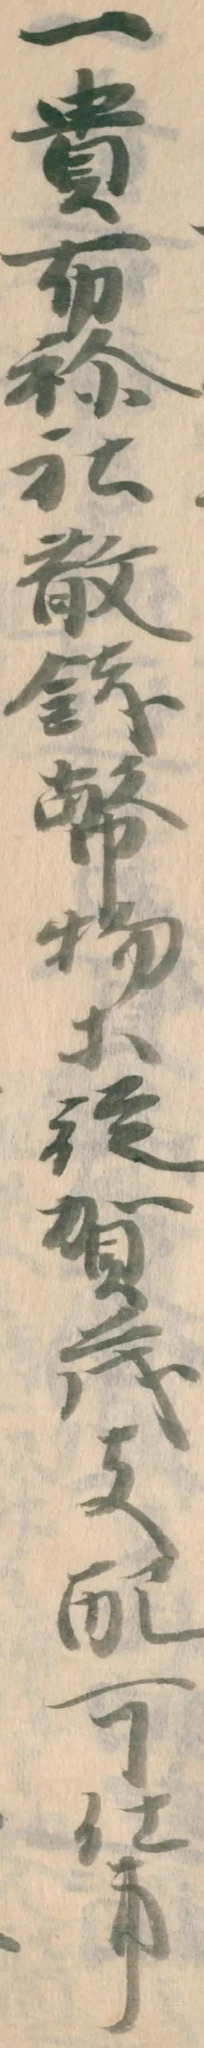一貴ふね社散銭幣物等従賀茂支配可仕事
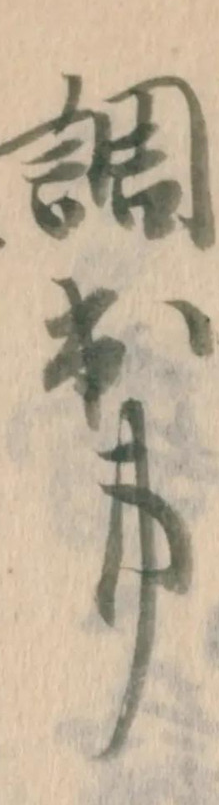調出事
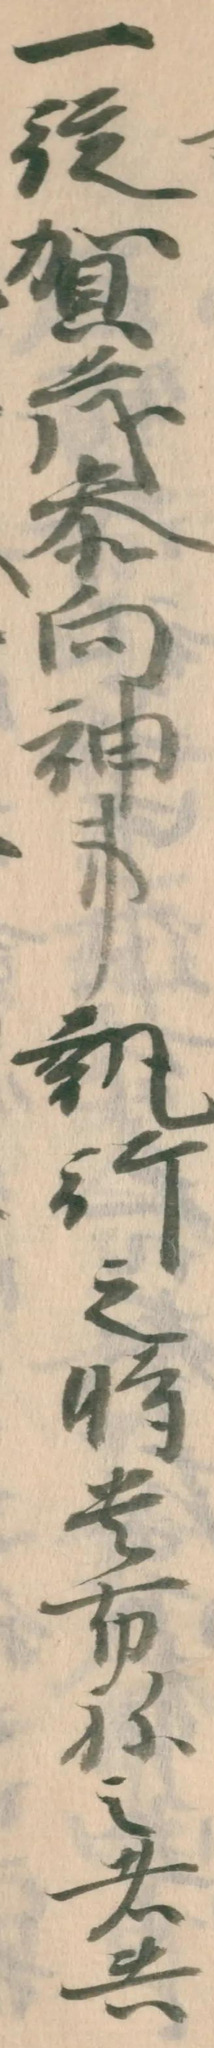一従賀茂参向神事執行之時貴ふね之者共
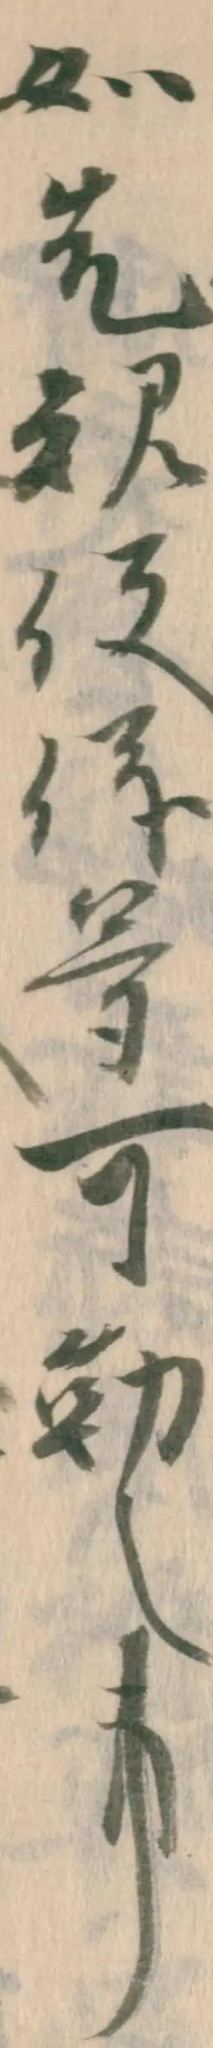如先規役儀等可勤之事
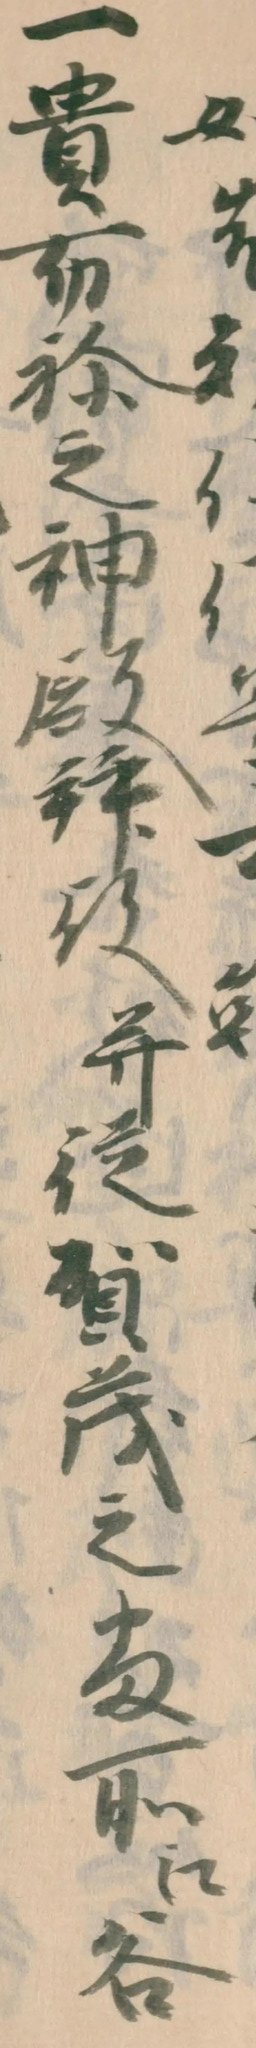一貴ふね之神殿拝殿并従賀茂之番所え谷
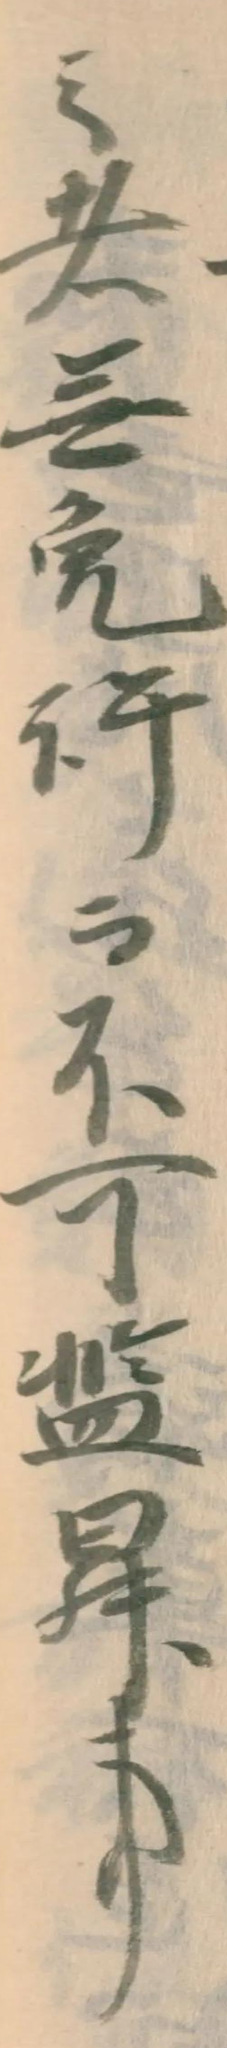之者無免許而不可濫昇事
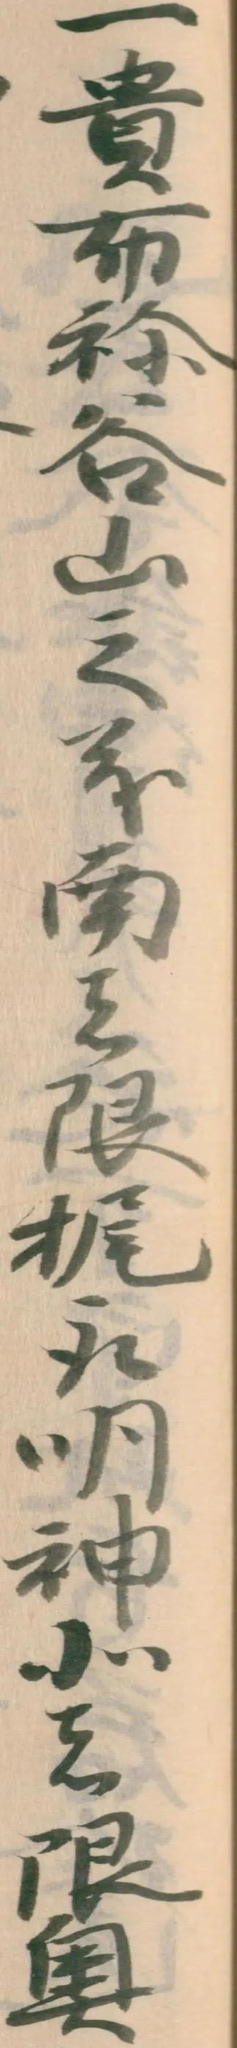一貴ふね谷山之義南は限梶取明神北は限奥
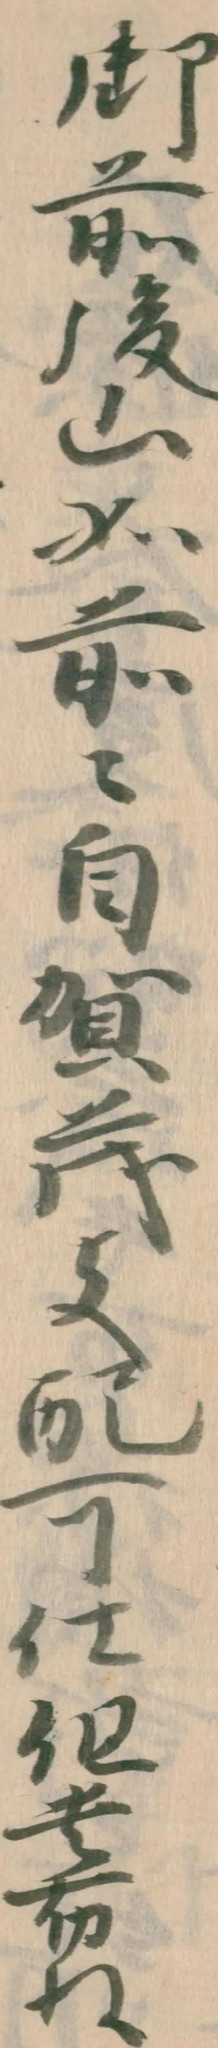御前後山如前々自賀茂支配可仕但貴ふね
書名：賀茂社記録. 第1冊
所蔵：国立国会図書館 National Diet Library, JAPAN
